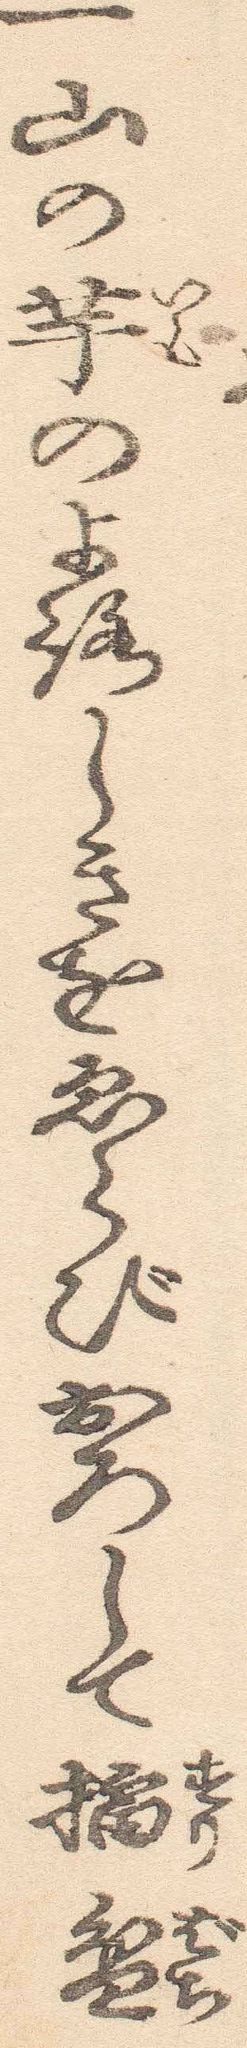一山の芋のよろしきをゑらびおろして擂盆
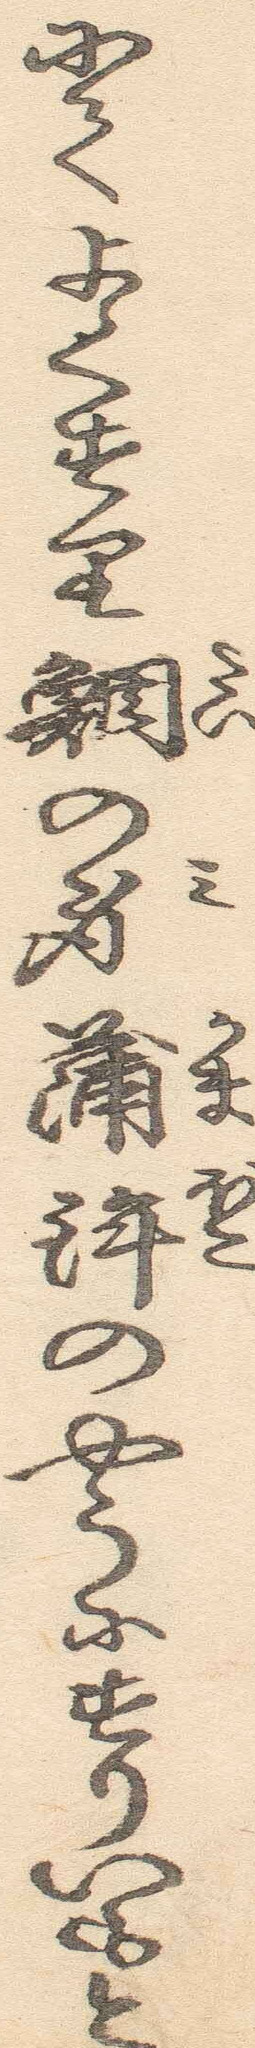にてよくすり鯛の身蒲鉾のやうにすりいもと
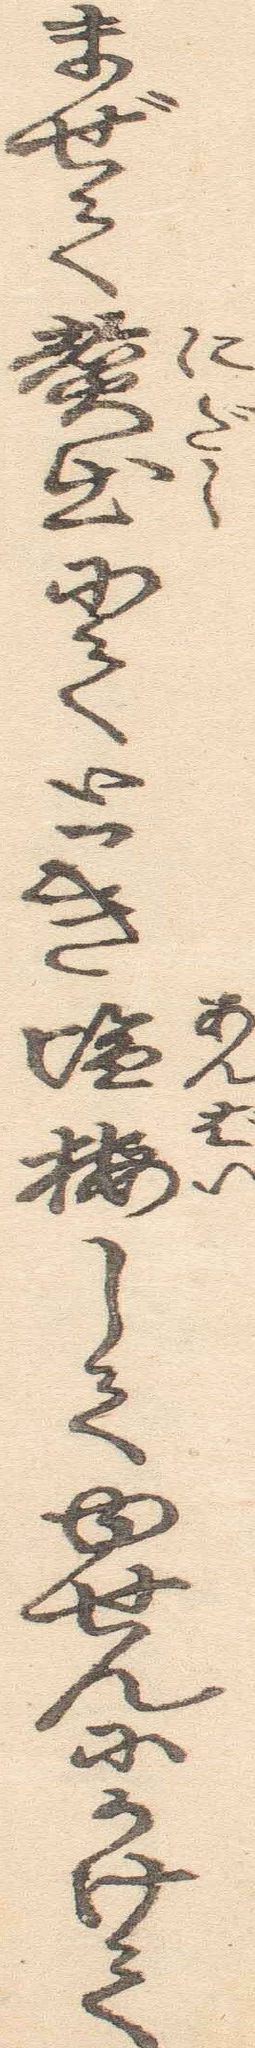まぜて煮出にてとき塩梅してゆせんにかけて
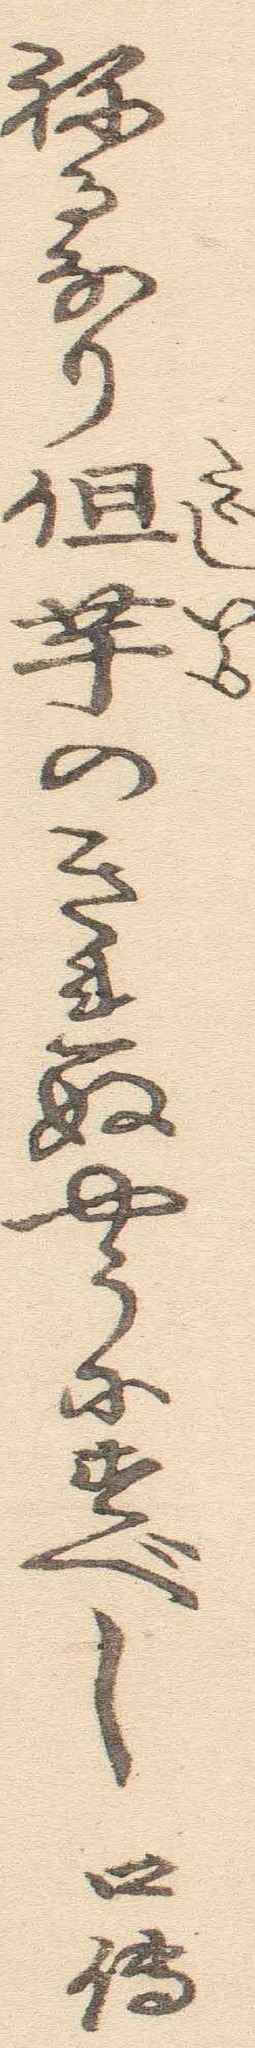ねるなり但芋のきれぬやうにすべし口伝
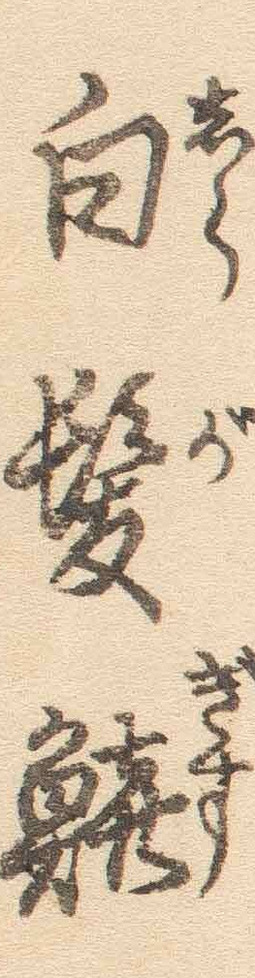白髪鱚
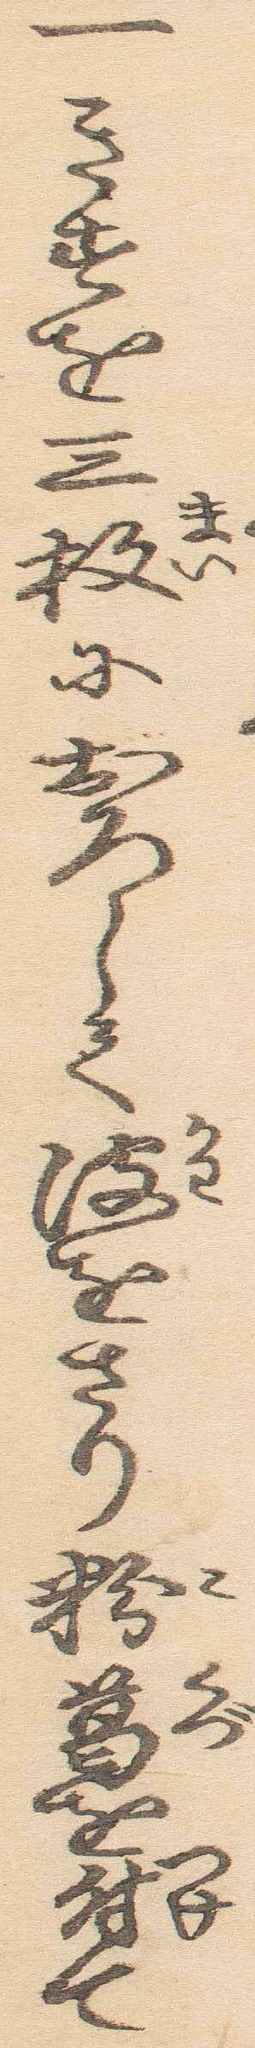一きすを三枚におろして皮をさり粉葛を付て

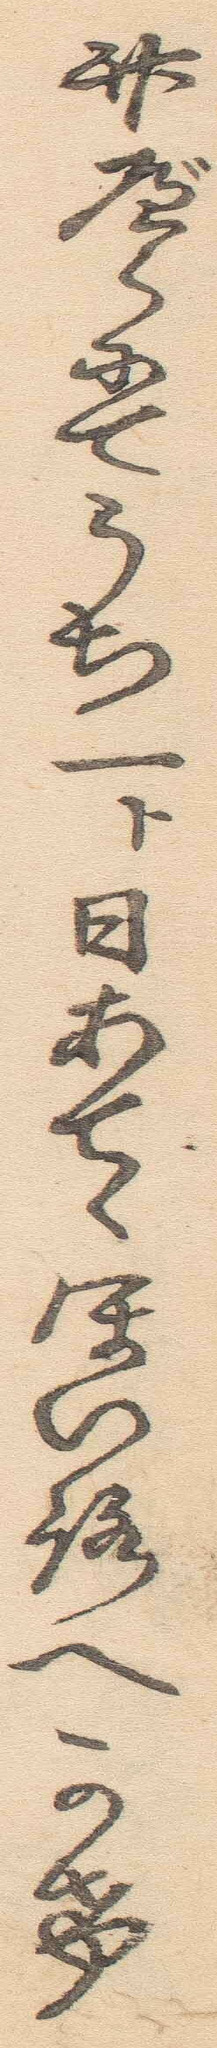竹べらにてうち一と日あてゝほいろへかけ
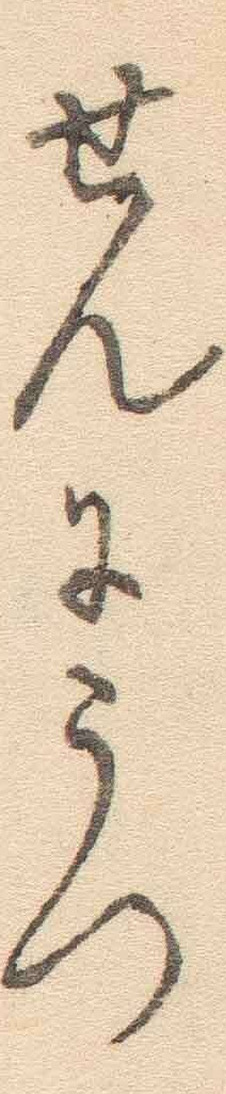せんにうつ
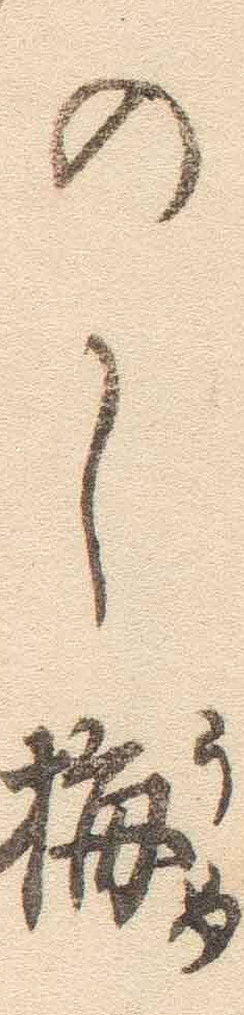のし梅
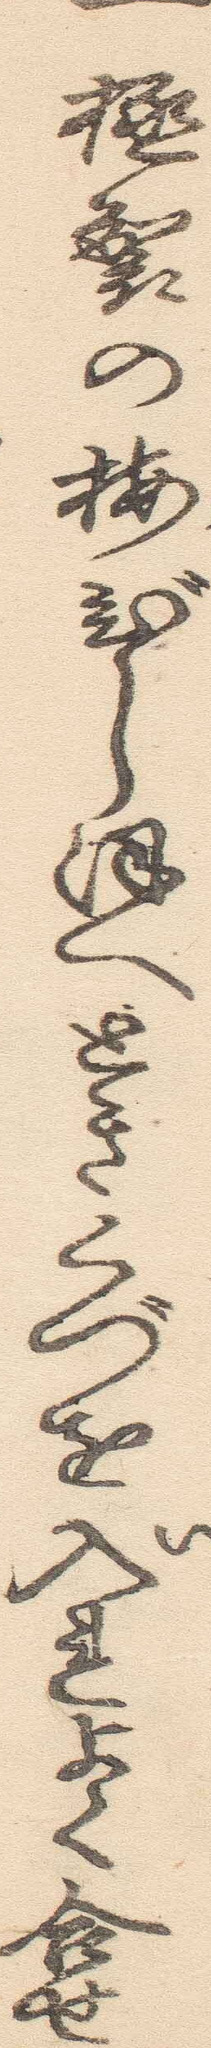一極製の梅びしほへときくづを入れよく合せ
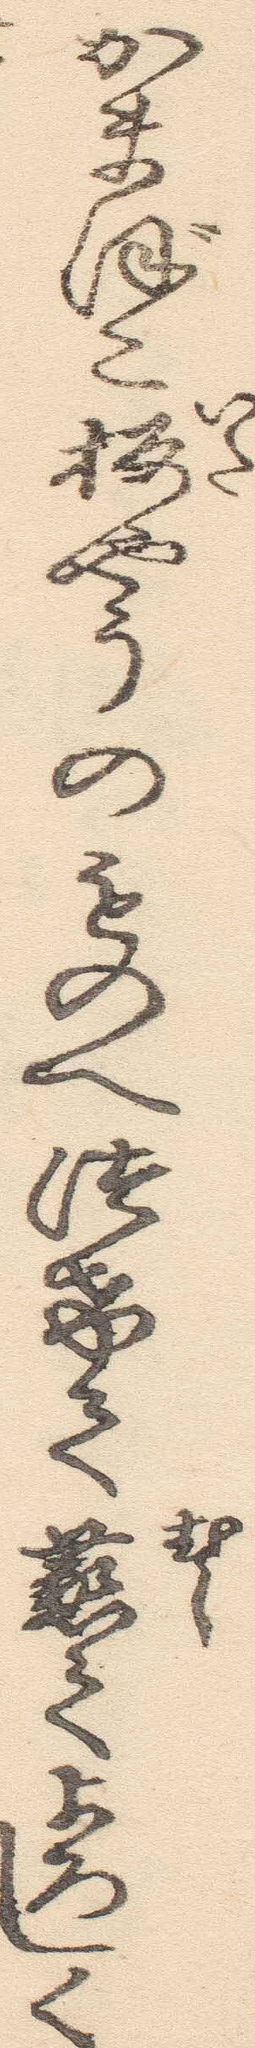かまぼこ板やうのものへつけて蒸てよろしく
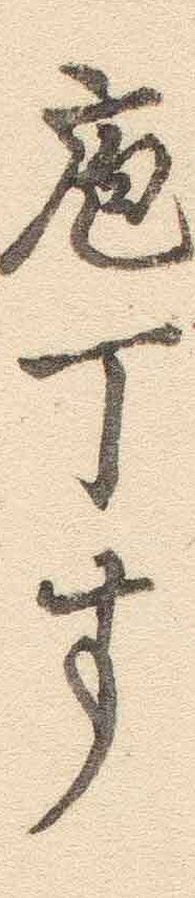庖丁す
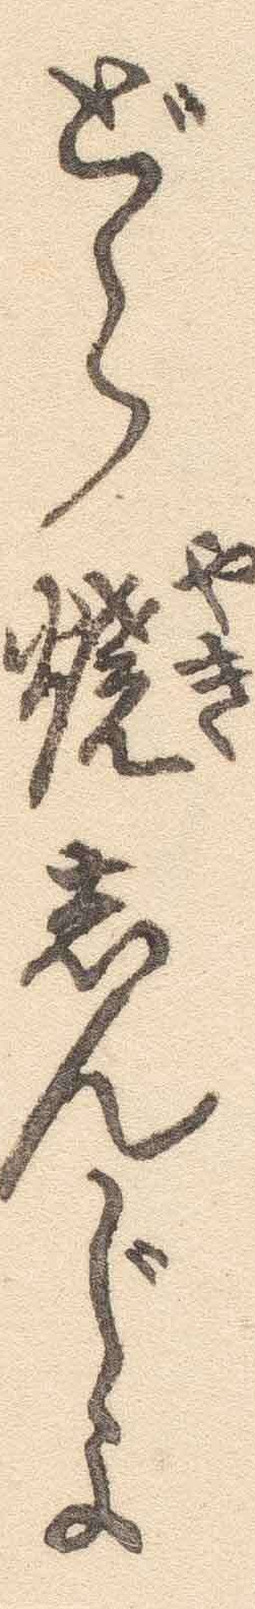どら焼しんじよ
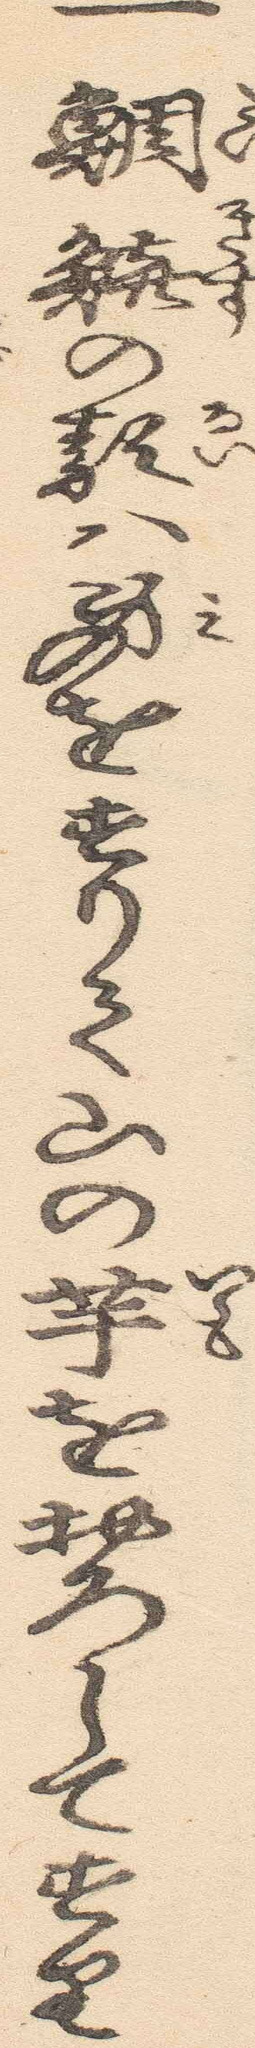一鯛鱚の類は身をすりて山の芋をおろしてすり
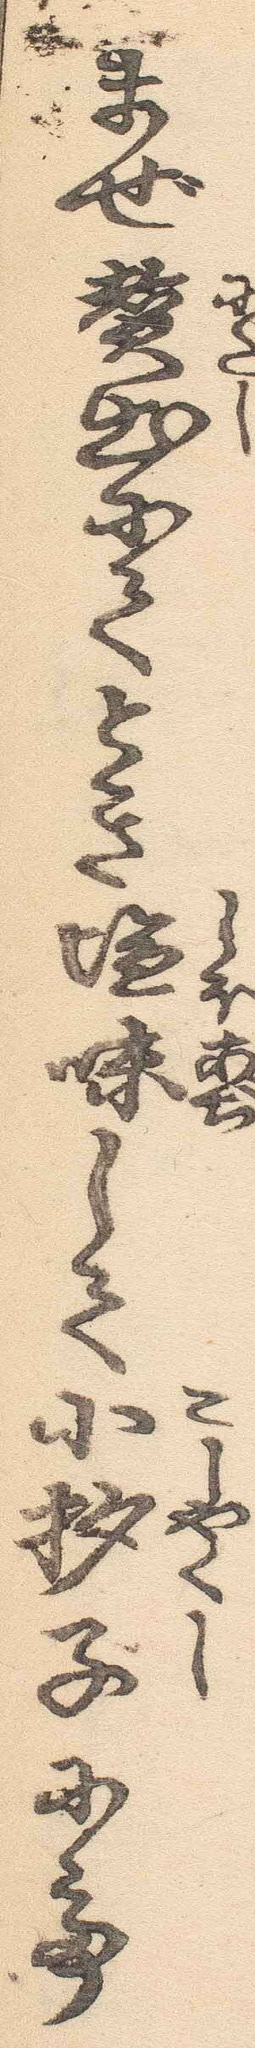まぜ煮出にてとき塩味して小杓子にて
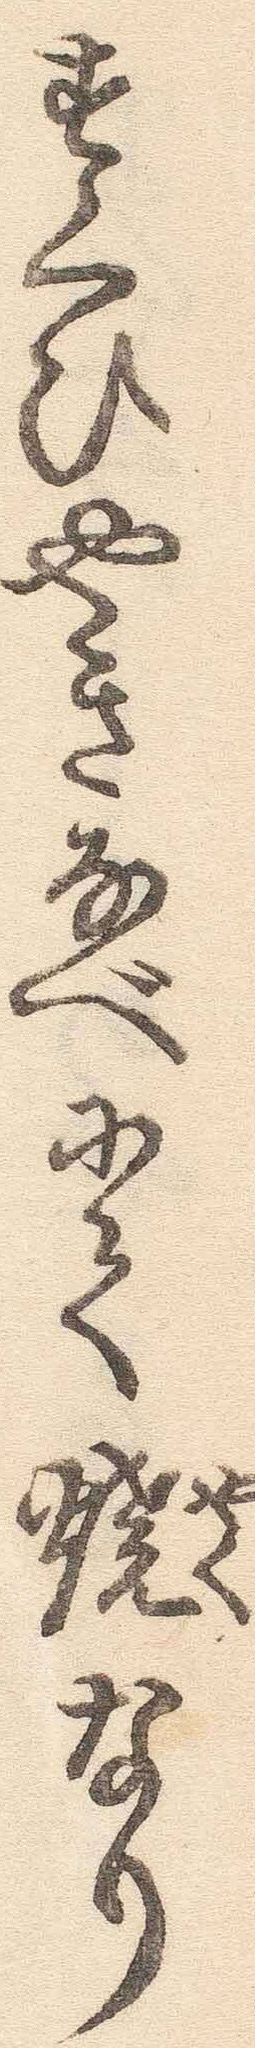すくひやきなべにて焼なり
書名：料理通
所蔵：東京学芸大学附属図書館 国文学研究資料館
